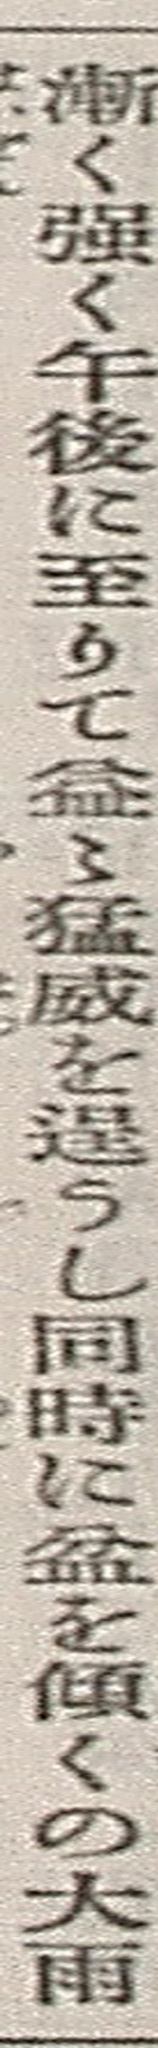漸く強く午後に至りて益々猛威を逞うし同時に盆を傾くの大雨
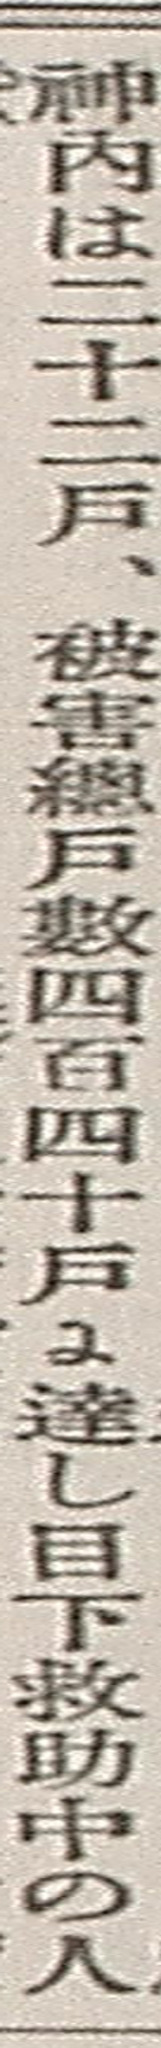神内は二十二戸、被害総戸数四百四十戸に達し目下救助中の人
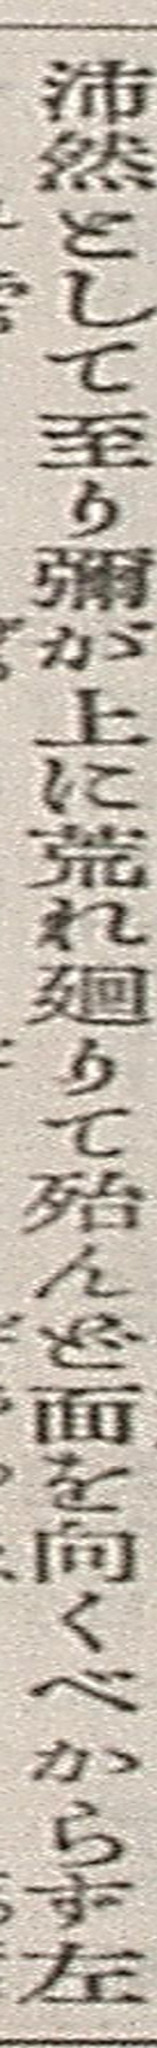沛然として至り弥が上に荒れ廻りて殆んど面を向くべからず左
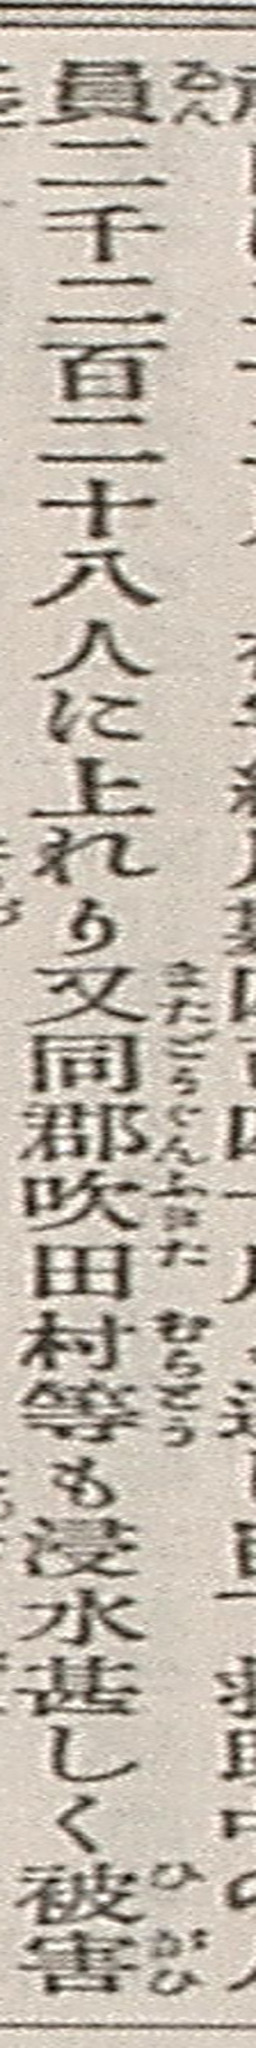員二千二百二十八人に上れり又同郡吹田村等も浸水甚しく被害
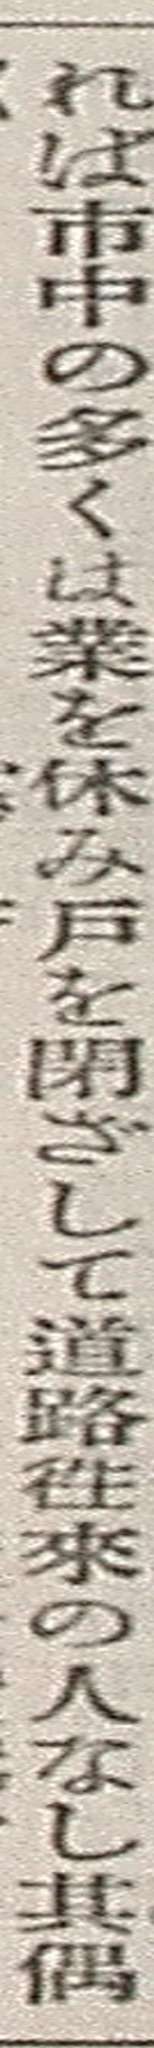れば市中の多くは業を休み戸を閉ざして道路往来の人なし其偶
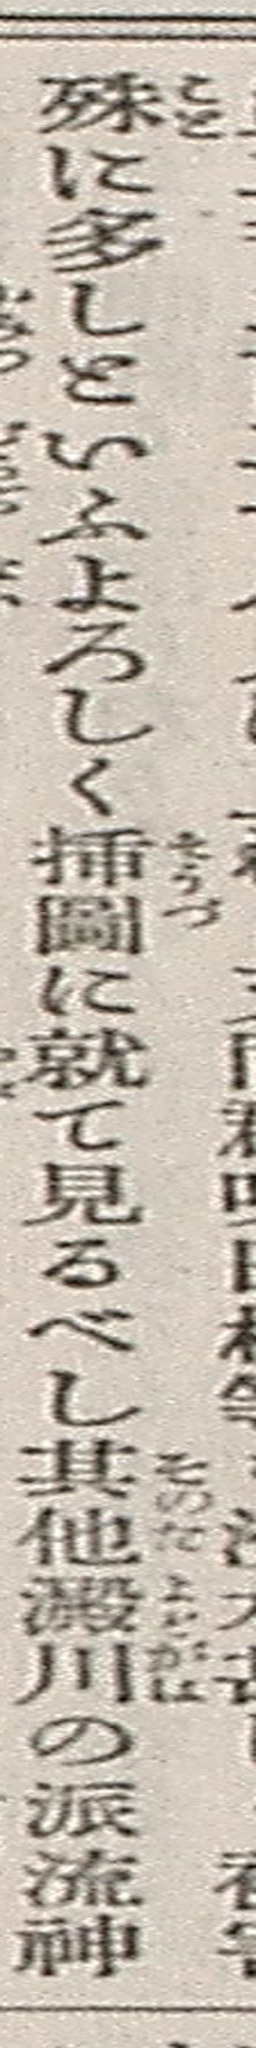殊に多しといふよろしく挿圖に就て見るべし其他澱川の派流神
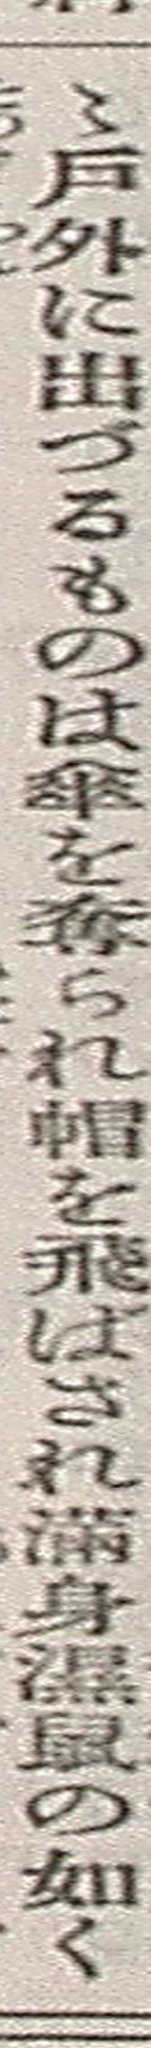々戸外に出づるものは傘を奪られ帽を飛ばされ満身濕鼠の如く
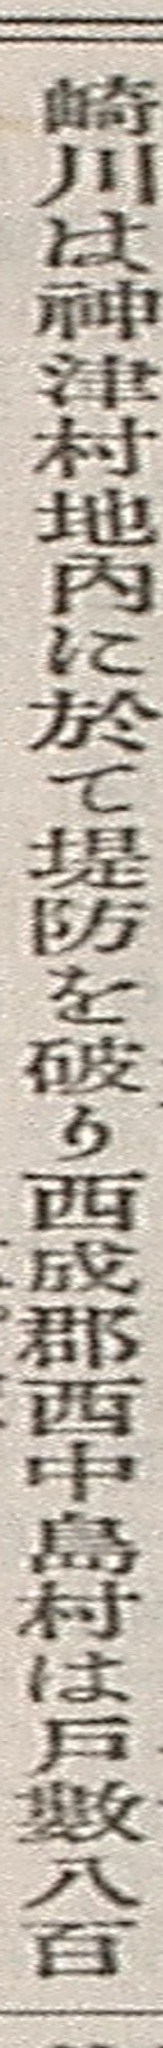崎川は神津村地内に於て堤防を破り西成郡西中島村は戸数八百
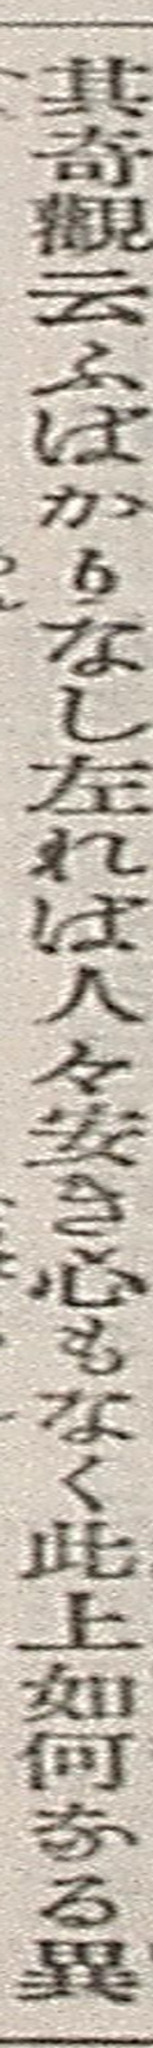其奇観云ふばかりなし左れば人々安き心もなく此上如何なる異
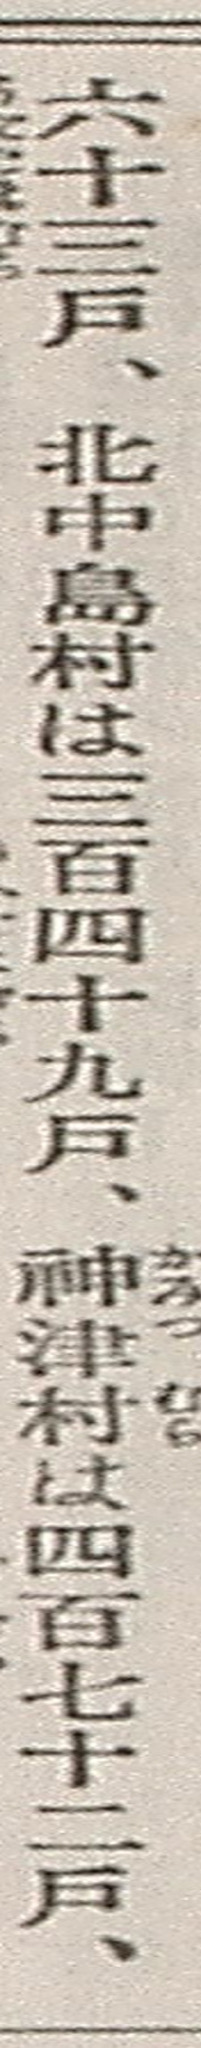六十三戸、北名中島村は三百四十九戸、神津村は四百七十二戸、
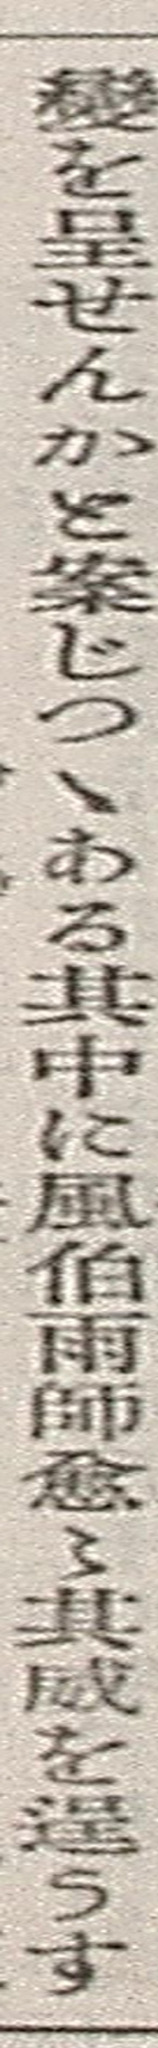変を呈せんかと案じつゝある其中に風伯雨師愈々其威を逞うす
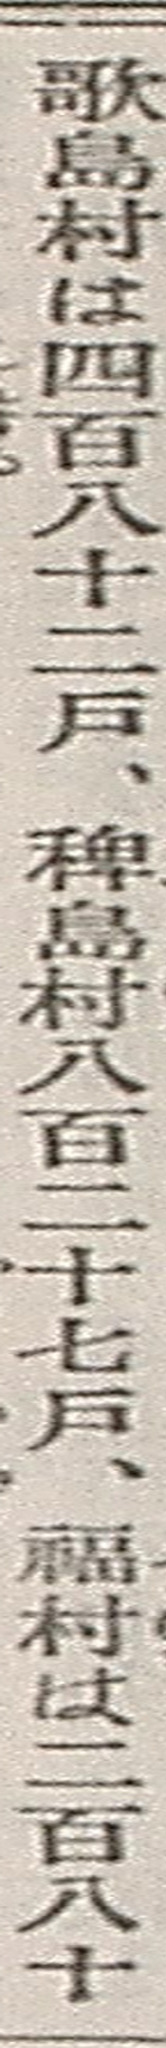歌島村は四百八十二戸、稗島村八百二十七戸、福村は二百八十
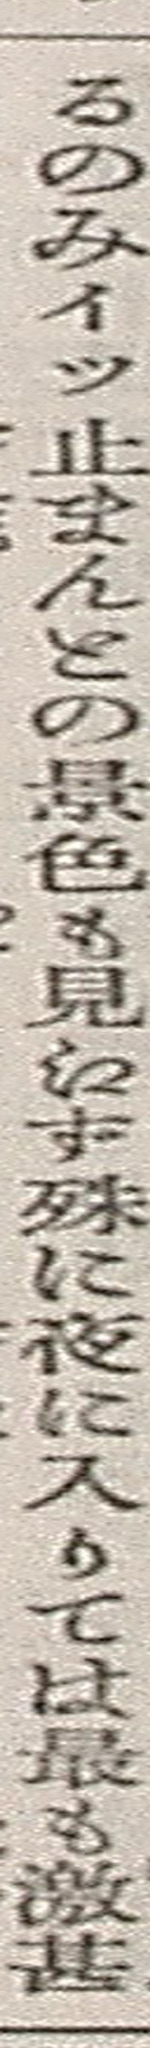るのみイツ止まんとの景色も見江ず殊に夜に入りては最も激甚
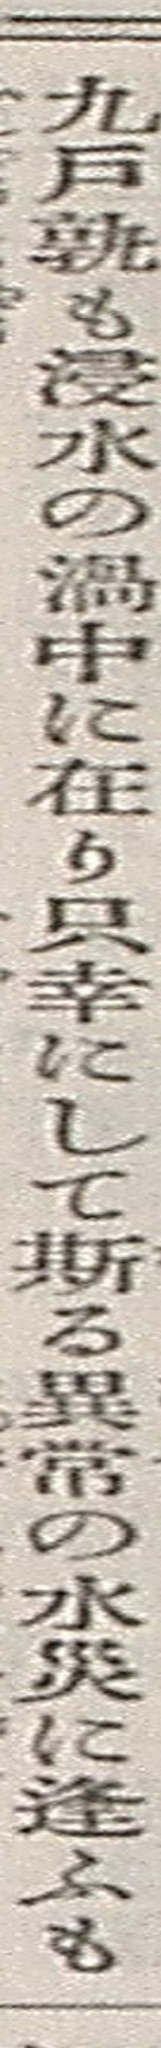九戸孰も浸水の渦中に在り只幸にして斯る異常の水災に逢ふも
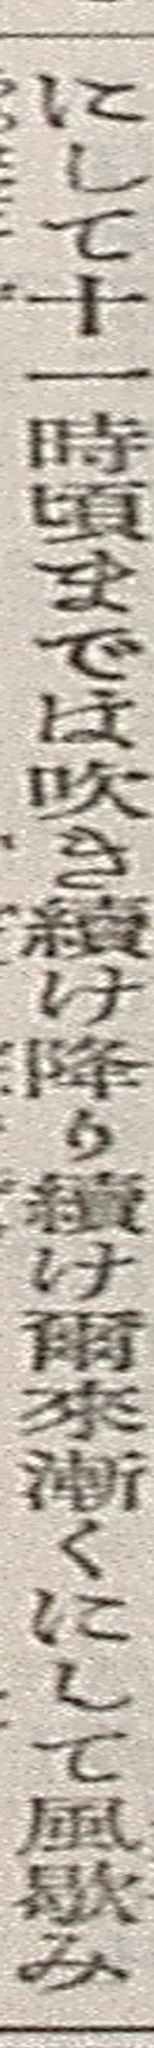にして十一時頃までは吹き続け降り続け爾来漸くにして風歇み
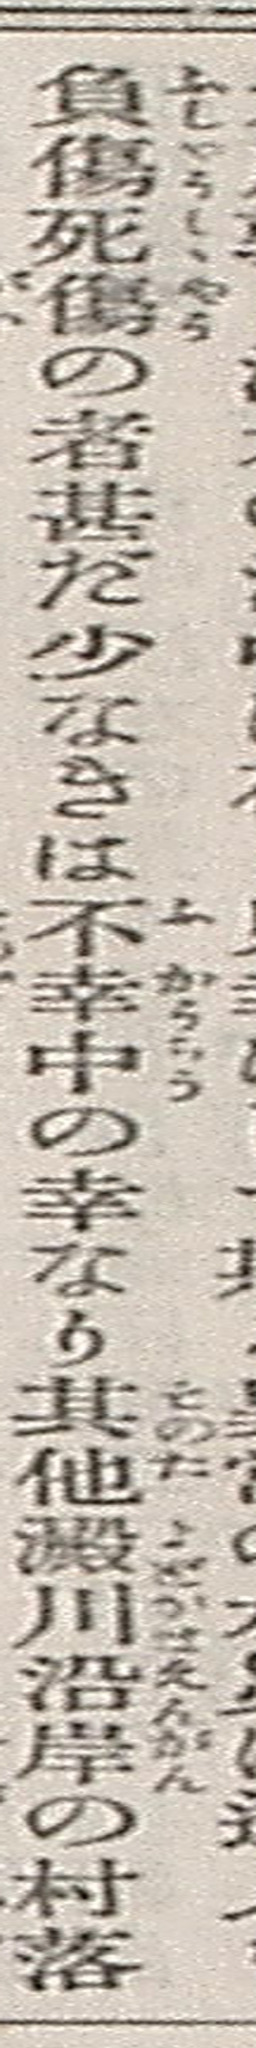負傷死傷の者甚だ少なきは不幸中の幸なり其他澱川沿岸の村落
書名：風俗畫報臨時増刊第百二十八號　洪水被害録（下）
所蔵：東京大学地震研究所図書室 Earthquake Research Institute Library, The University of Tokyo, JAPAN
